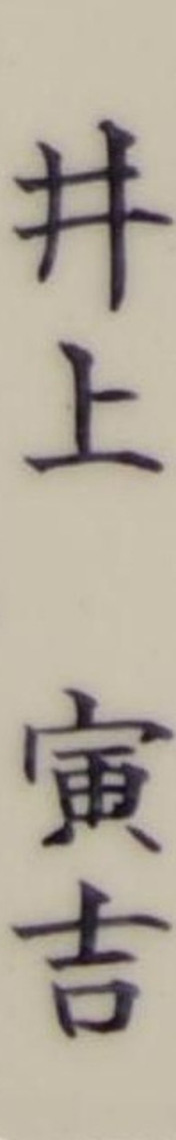井上寅吉
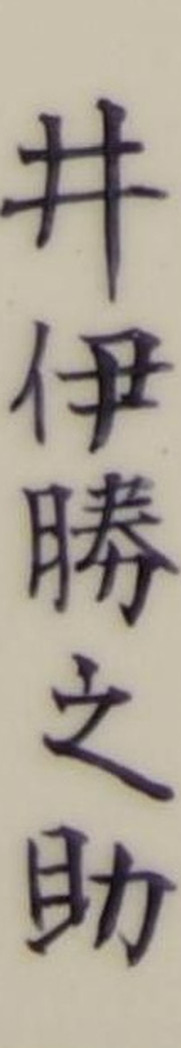井伊勝之助
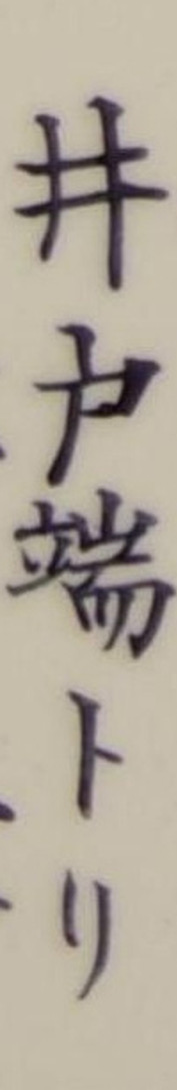井戸端トリ

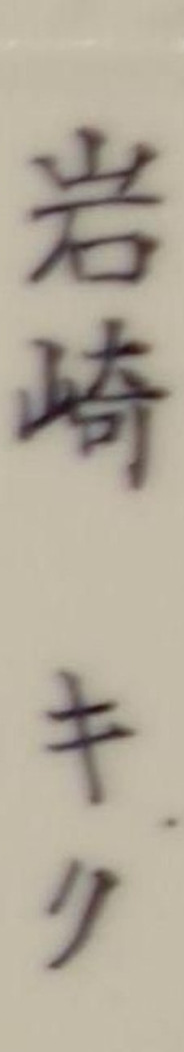岩崎キク
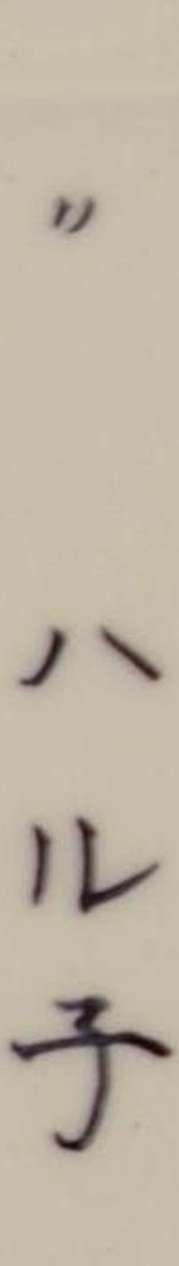ハル子
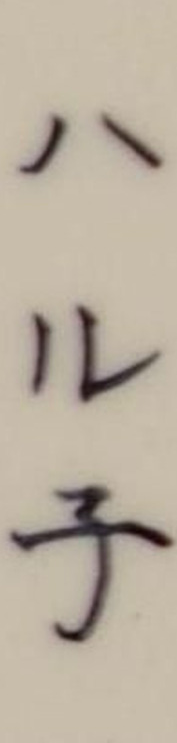ハル子
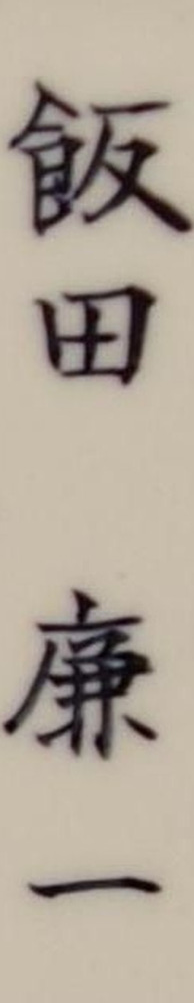飯田廉一
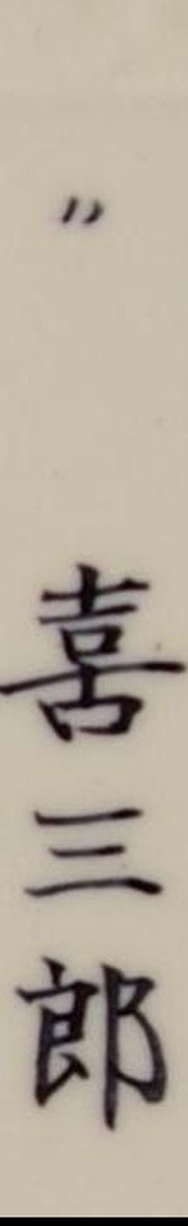喜三郎
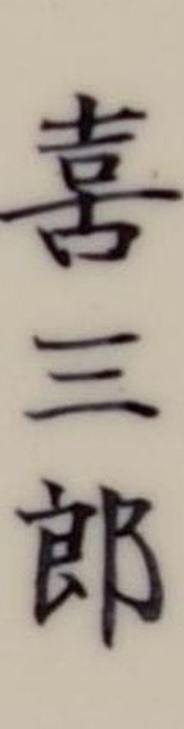喜三郎
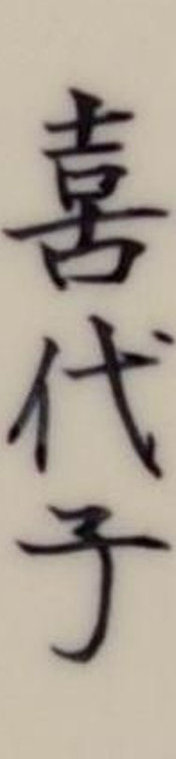喜代子
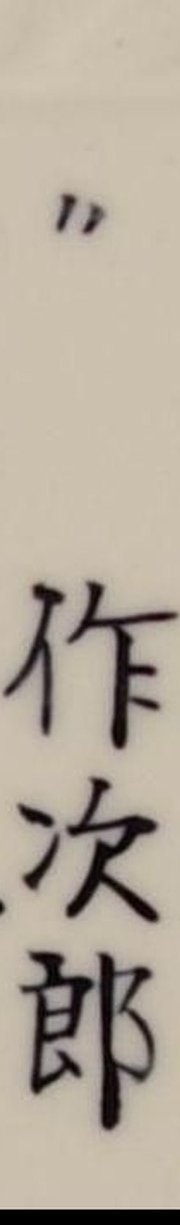作次郎
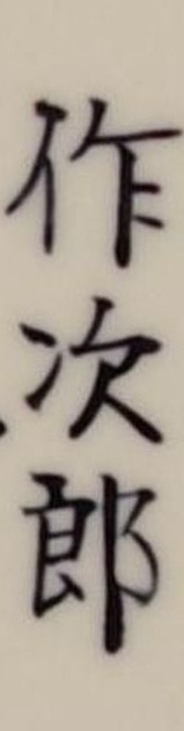作次郎
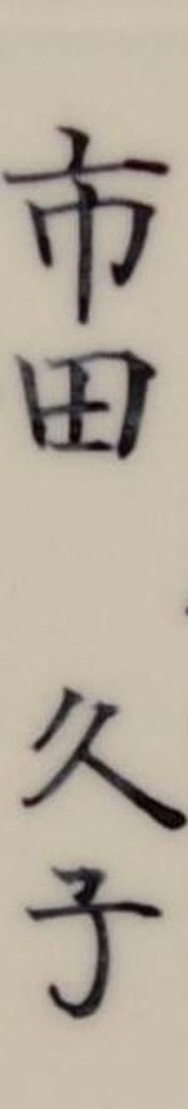市田久子
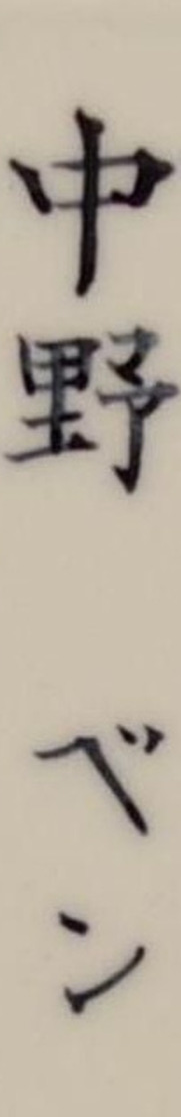中野ベン
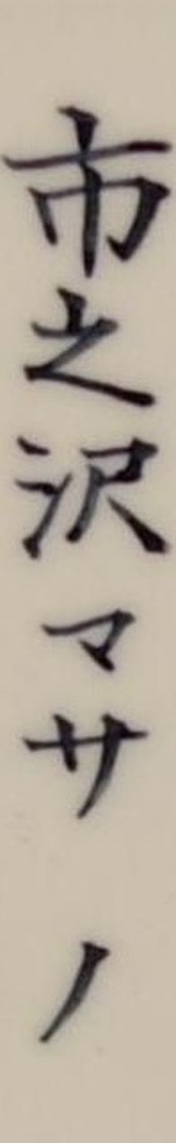市之沢マサノ
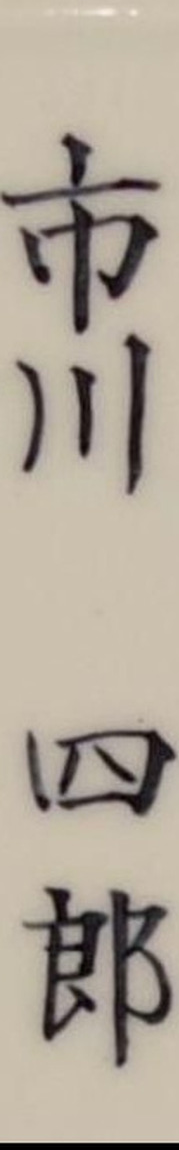市川四郎
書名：M~S
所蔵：高野山金剛峯寺
